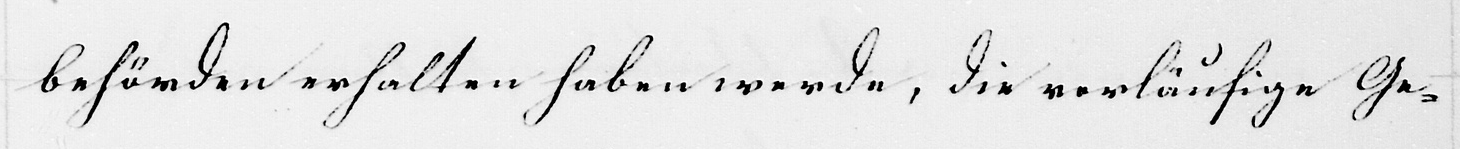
behörden erhalten haben werde, die vorläufige Ge¬
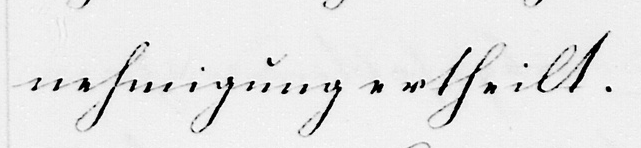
nehmigung ertheilt.
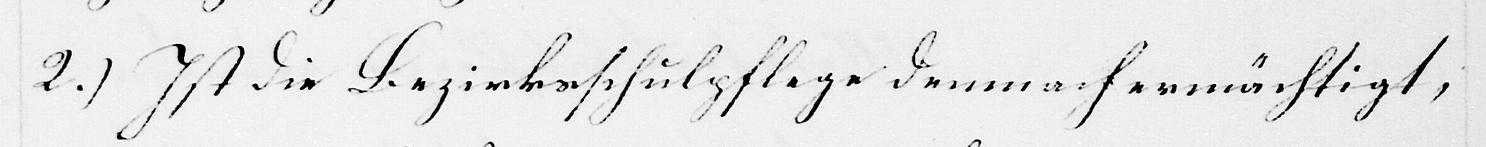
2.) Ist die Bezirksschulpflege demnach ermächtigt,
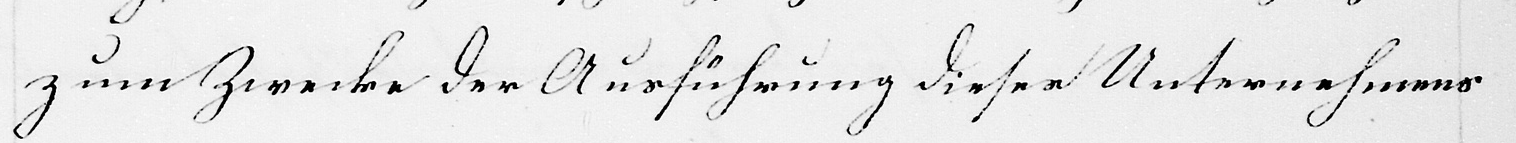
zum Zwecke der Ausführung dieses Unternehmens
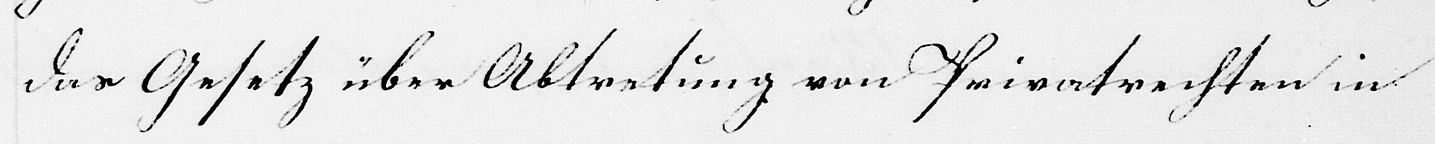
das Gesetz über Abtretung von Privatrechten in
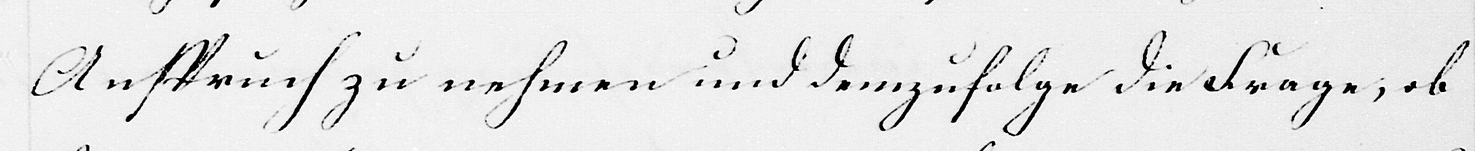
Anspruch zu nehmen und demzufolge die Frage, ob
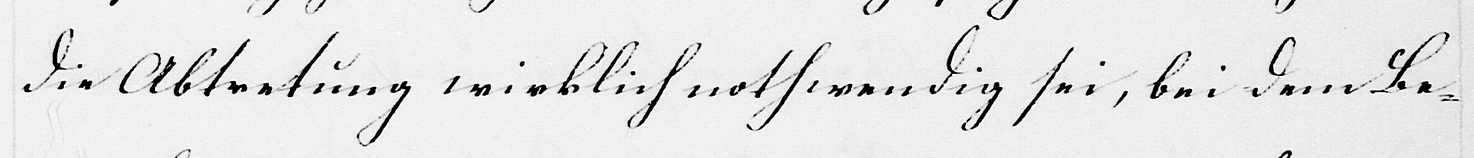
die Abtretung wirklich nothwendig sei, bei dem Be¬
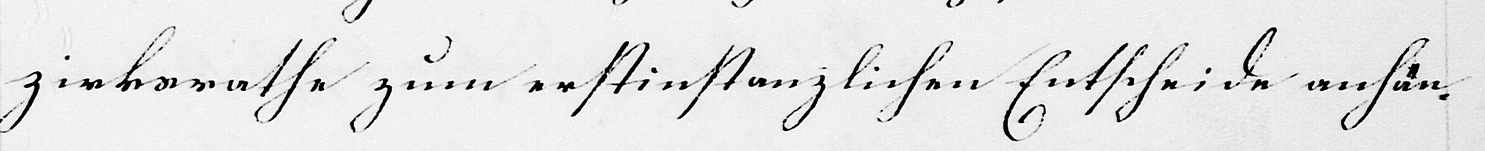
zirksrathe zum erstinstanzlichen Entscheide anhän¬
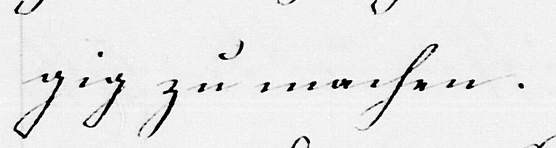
gig zu machen.
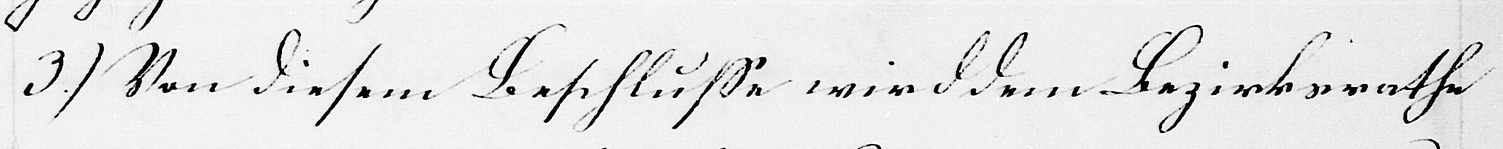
3.) Von diesem Beschluße wird dem Bezirksrathe
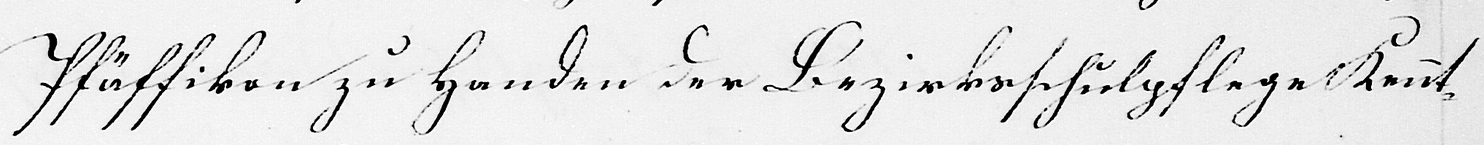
Pfäffikon zu Handen der Bezirksschulpflege Kennt¬
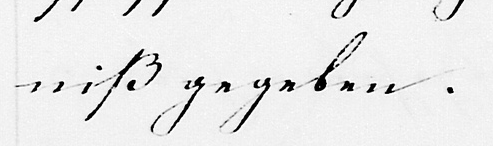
niß gegeben.
